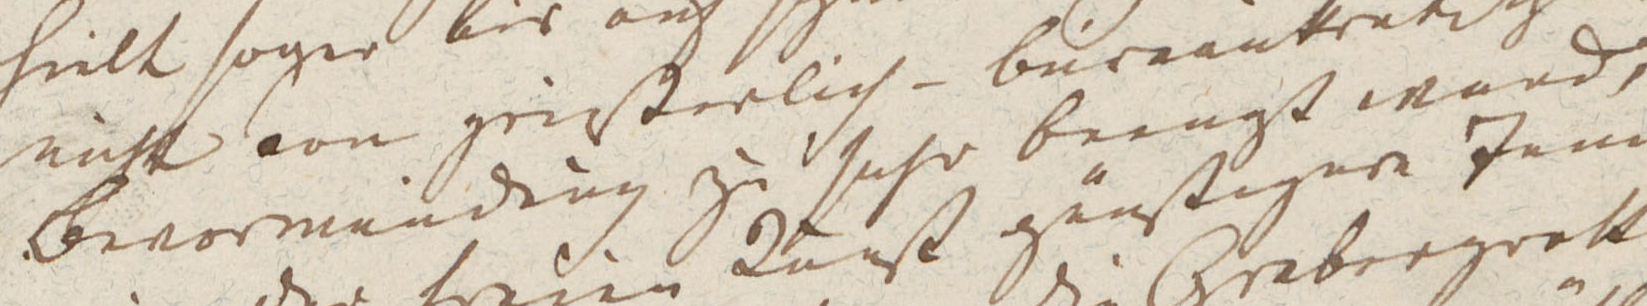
Bevormundung zu sehr beengt ward,
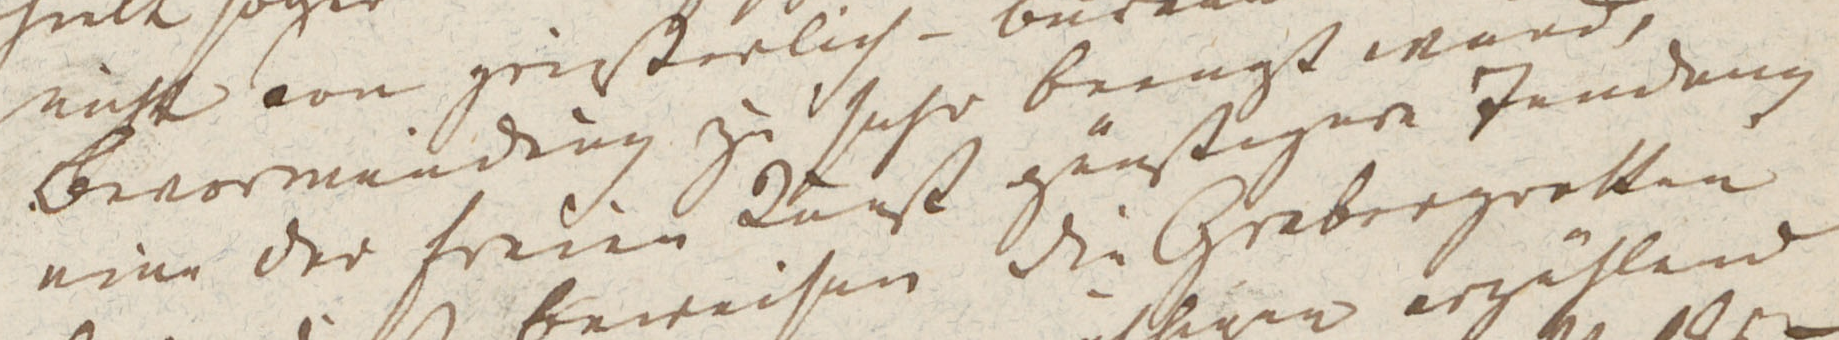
eine der freien Kunst günstigere Tendenz
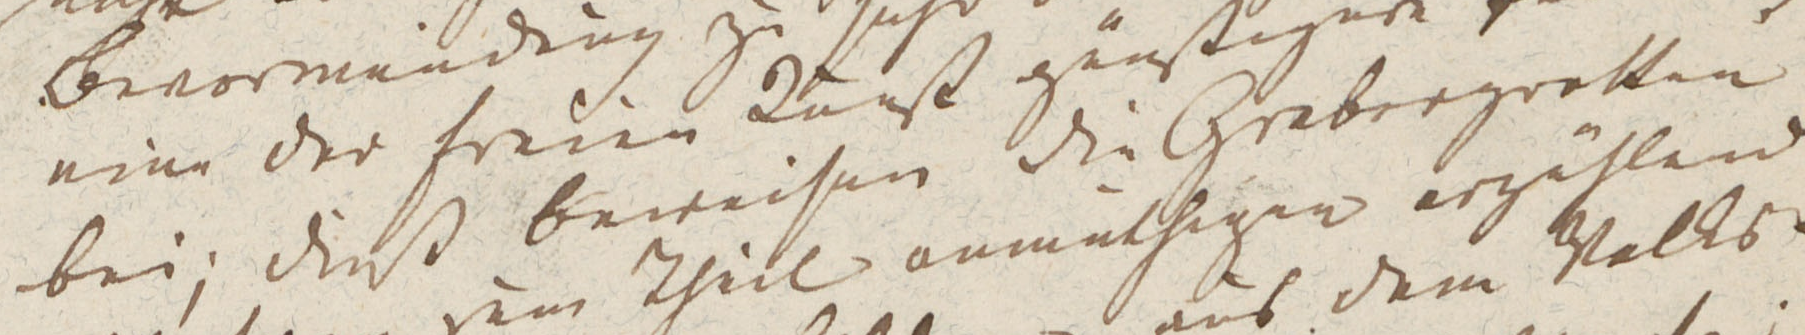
bei; diess beweisen die Grabergrotten
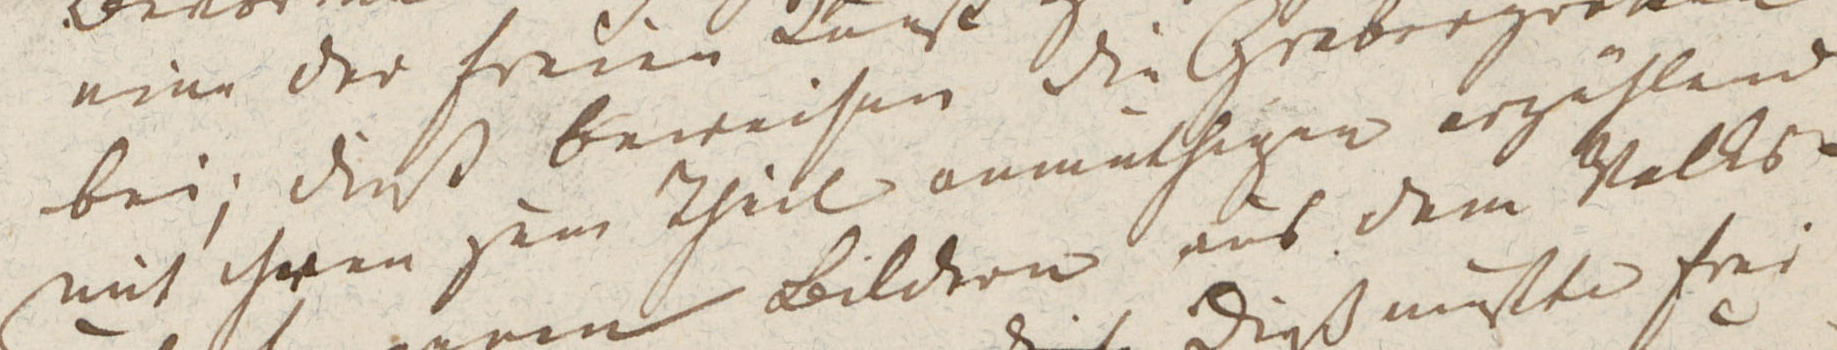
mit ihren zum Theil anmuthigen erzählend
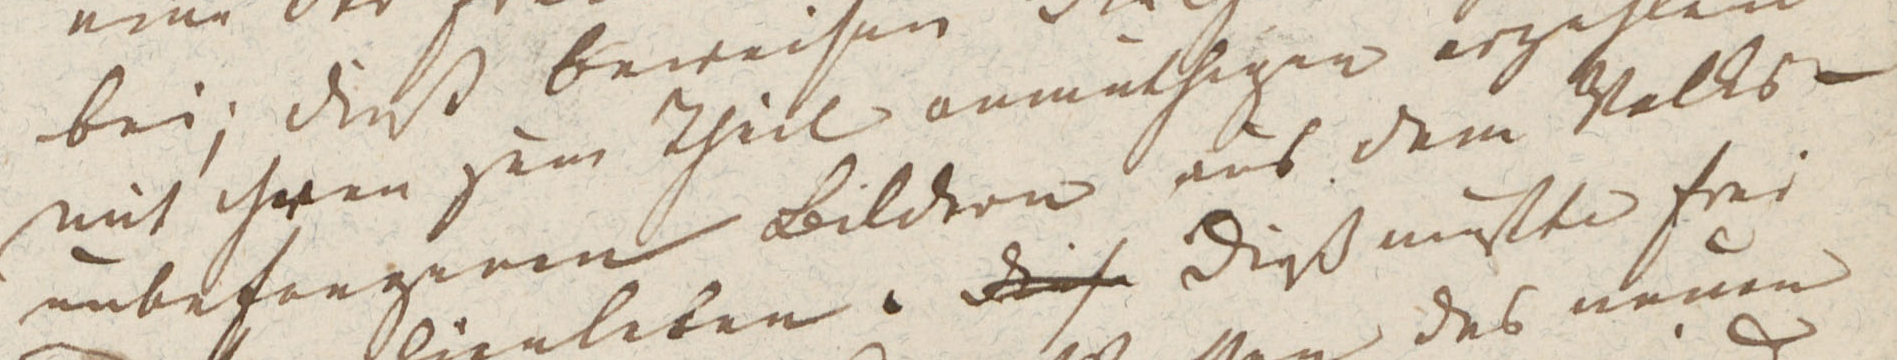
unbefangenen Bildern aus dem Volks-
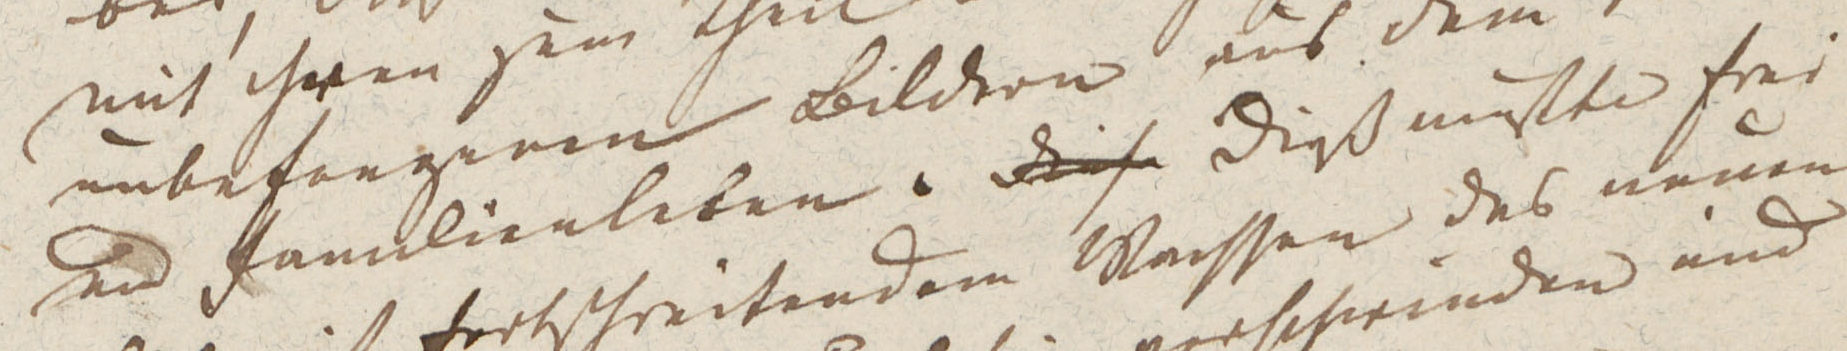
und Familienleben. Diese Diess musste frei
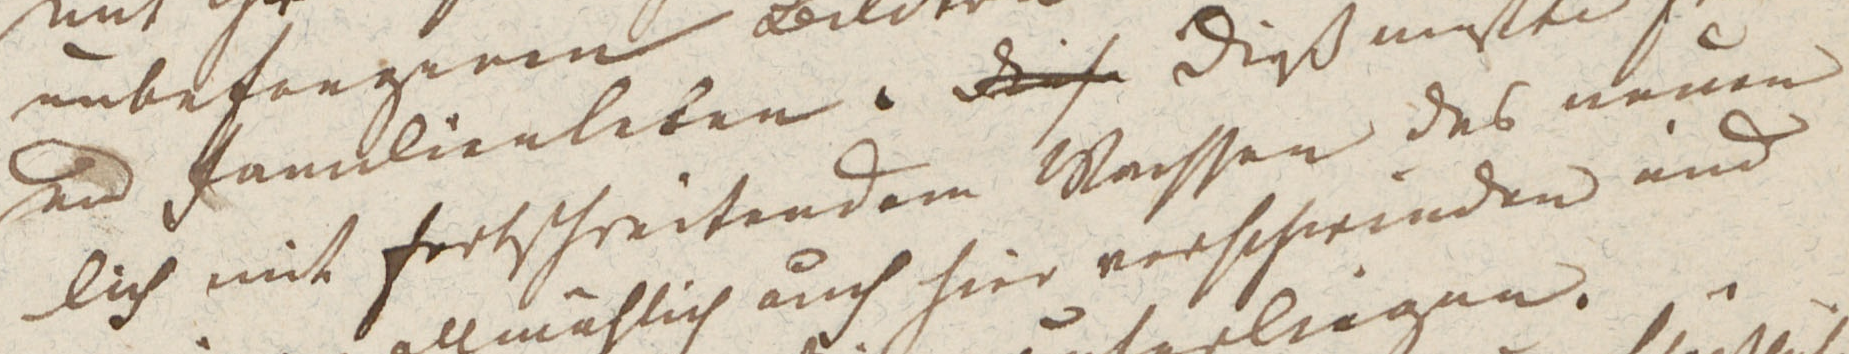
lich mit fortschreitendem Wachsen des neuen
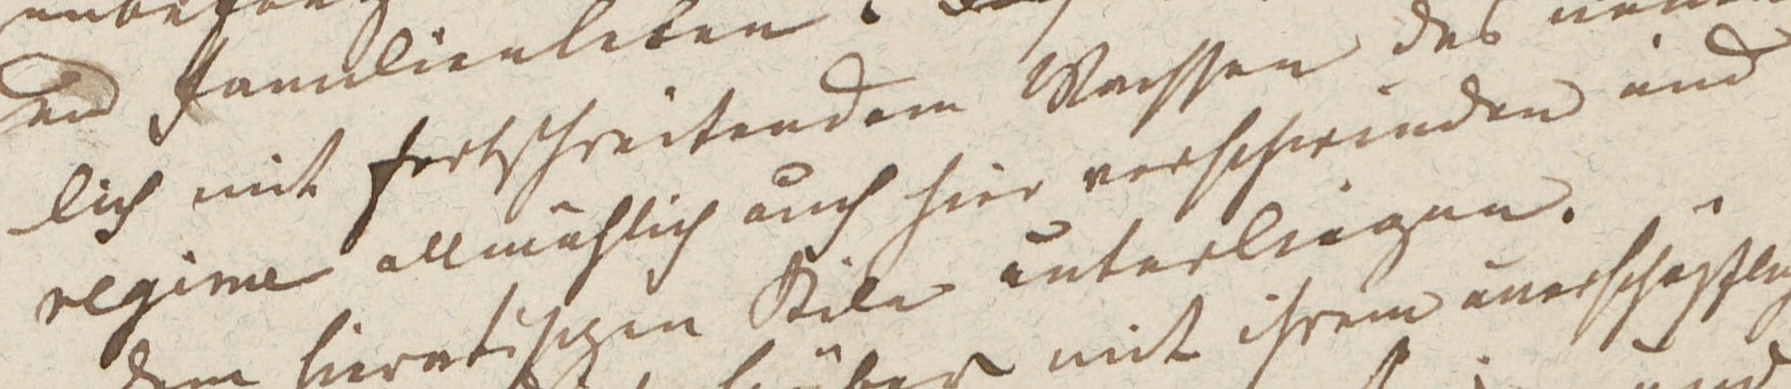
regime allmählich auch hier verschwinden und
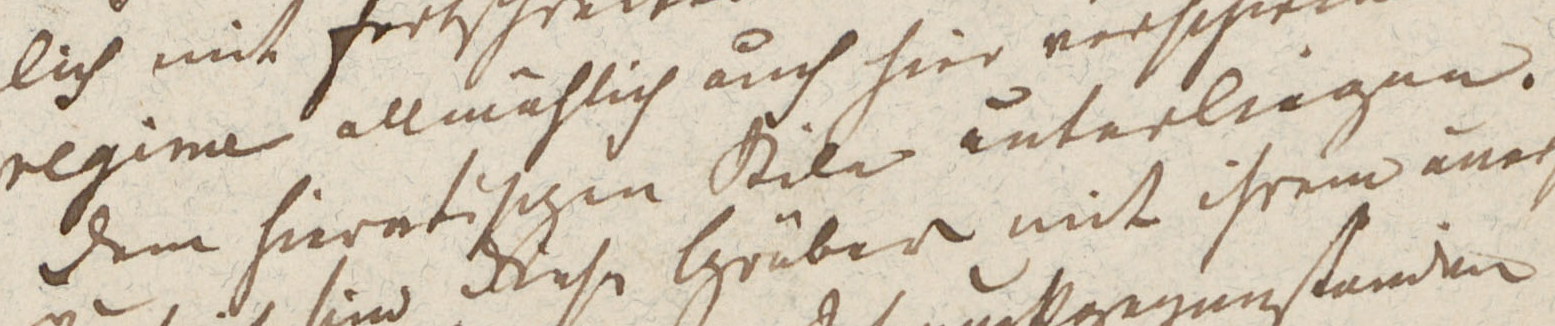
dem hieratischen Stile unterliegen.
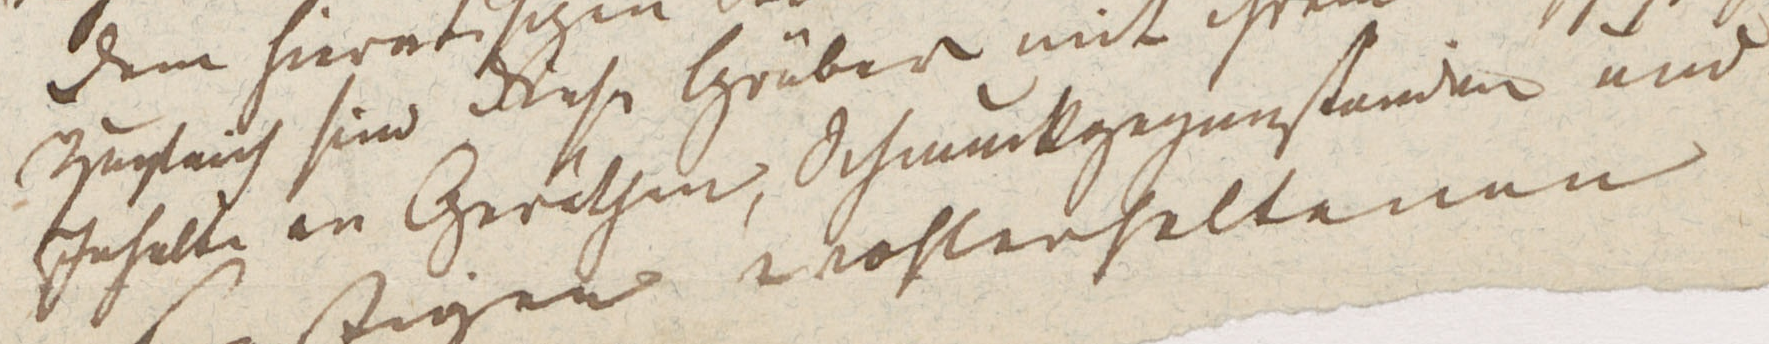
Inhalte an Geräthen, Schmuckgegenständen und
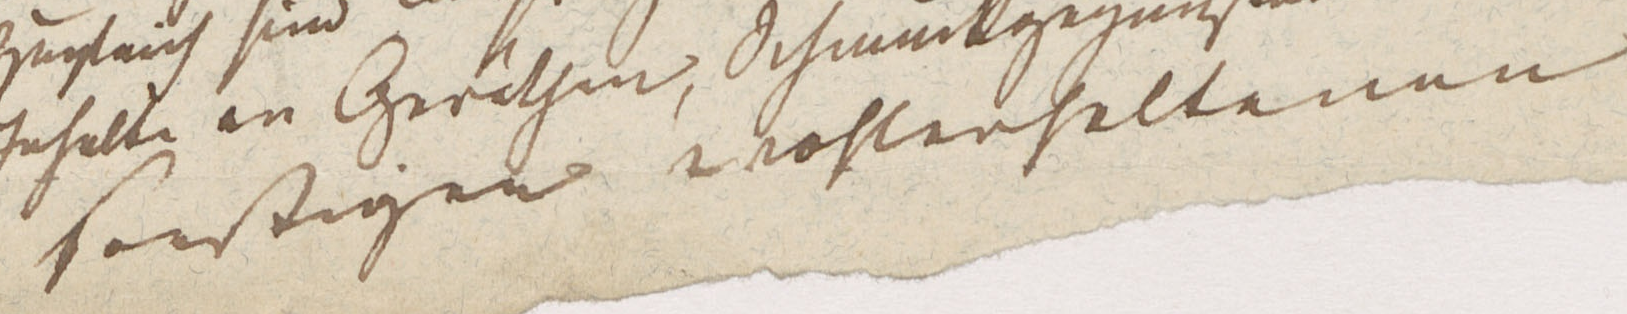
sonstigen wohlerhaltenen
